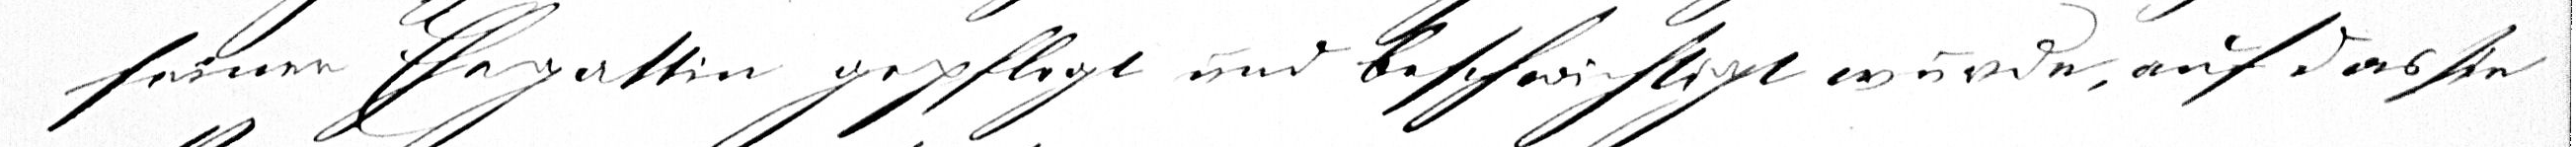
seinen Ehegattin gepflegt und beschwichtigt wurde, auf das sie
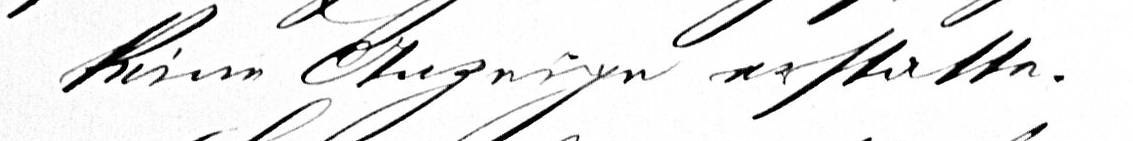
keine Anzeige erstatte.
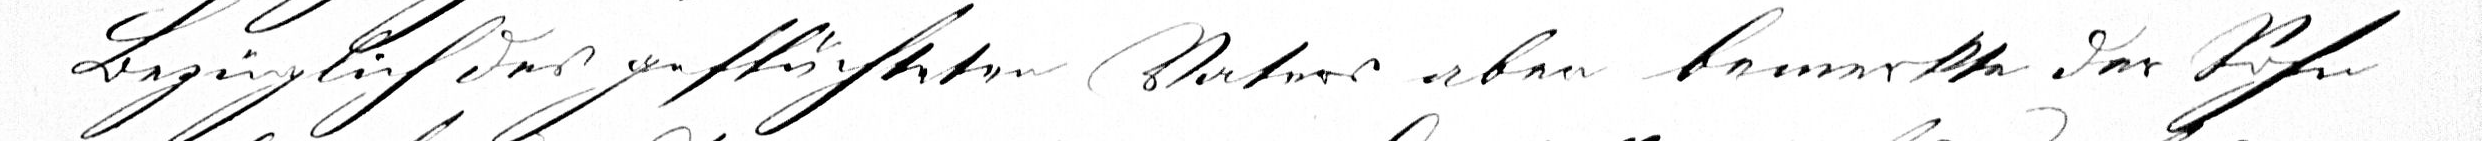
Bezüglich des geflüchteten Vaters aber bemerkte der Sohn
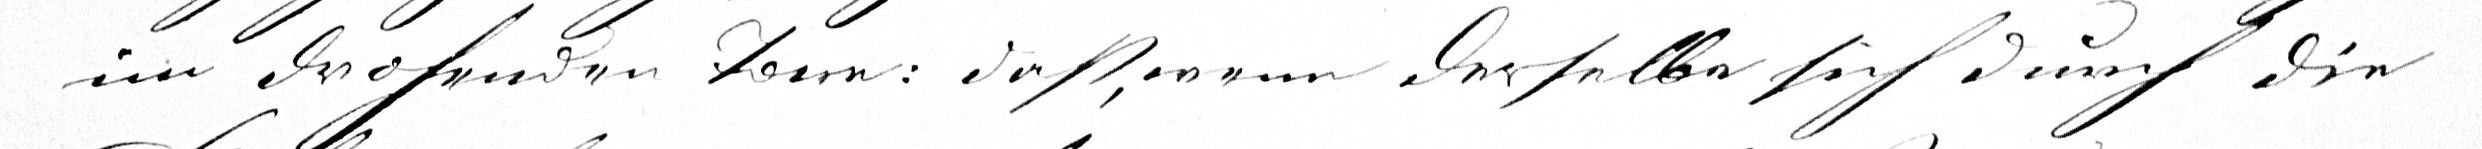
im drohenden Bern: daß, wenn derselbe sich durch die
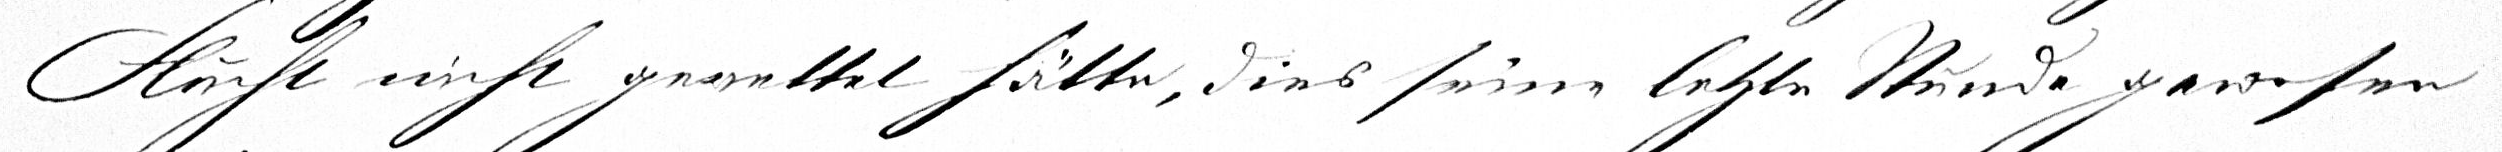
Flucht nicht gerettet hätte, dies seine letzte Stunde gewesen
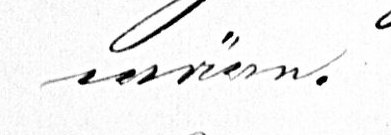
wäre.
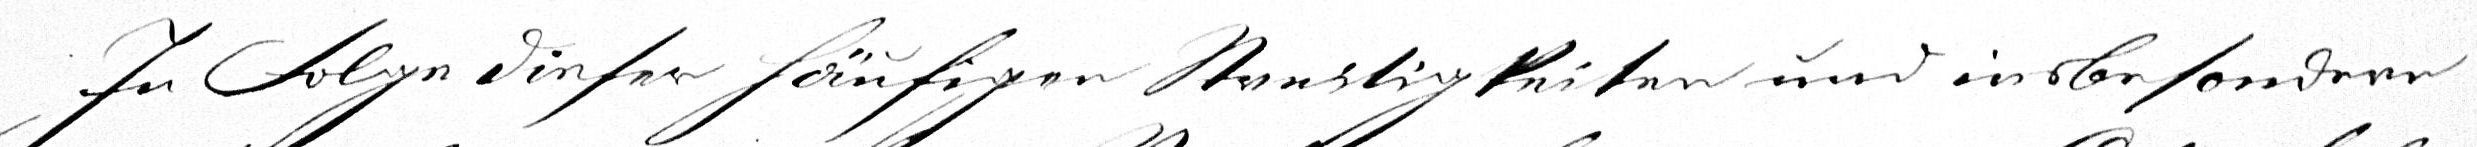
In Folge dieser häufigen Streitigkeiten und insbesondere
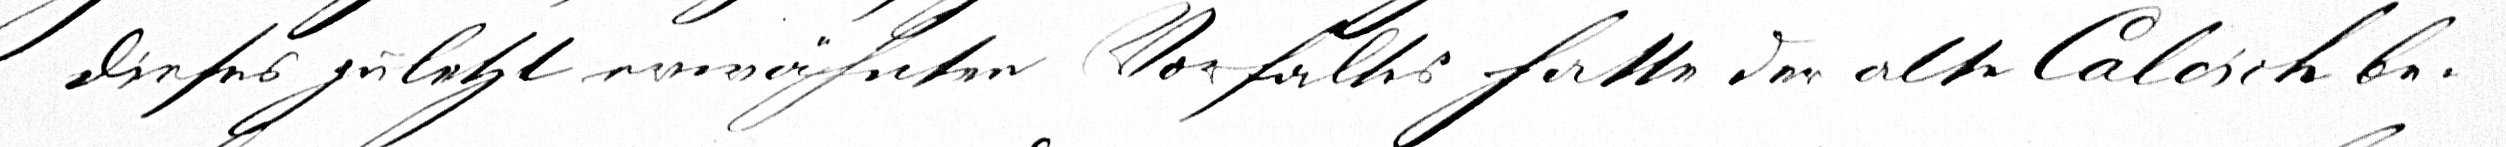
dieses zuletzt erwähnten Vorfaltes hatte der alte Calcich be¬
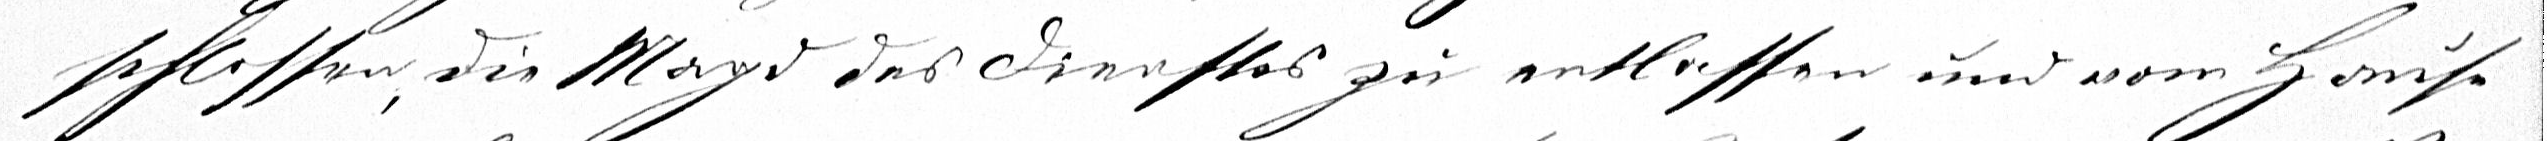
schlossen, die Magd des Dienstes zu entlassen und vom Hause
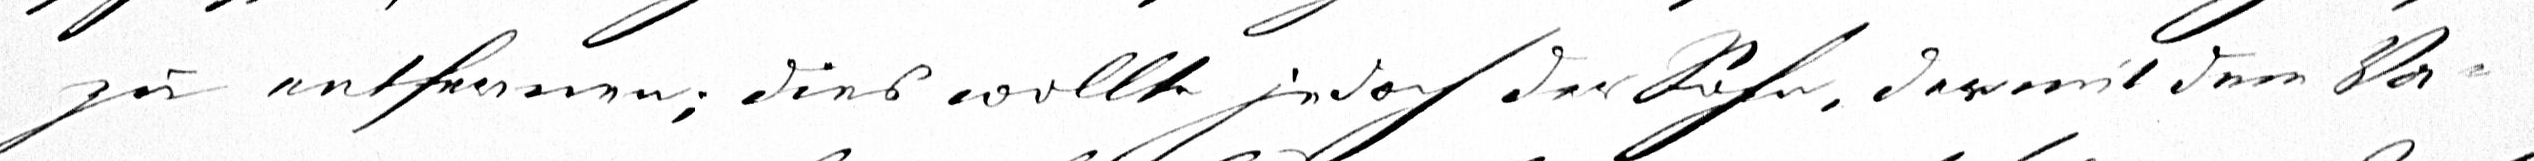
zu entfernen; dies wollt jedoch der Sohn, der mit dem Va¬
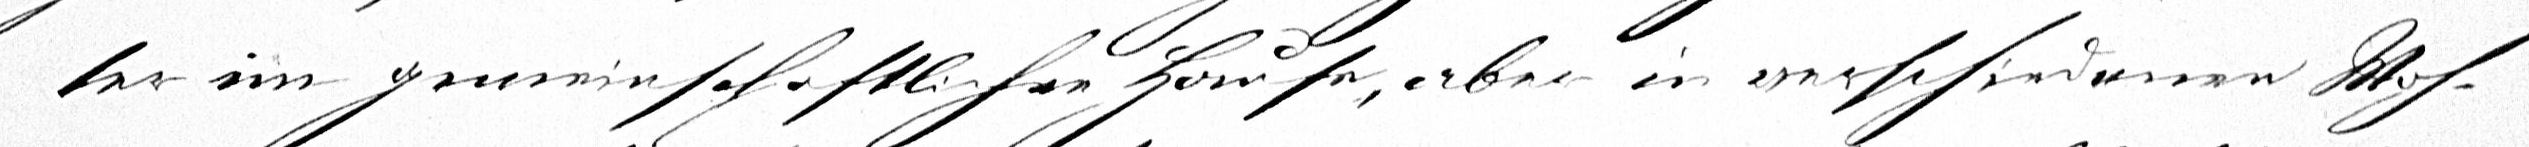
ter im gemeinschaftlicher Hause, aber in verschiedenen Woh¬
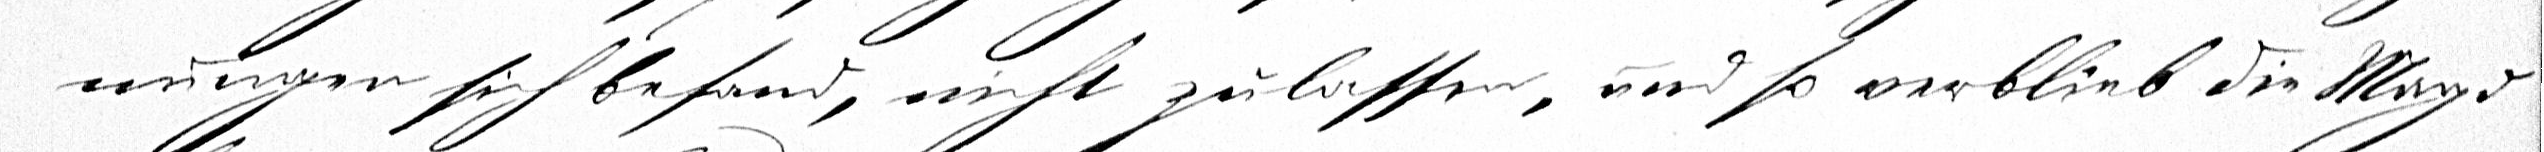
nungen sich befand, nicht zu lassen, und so verblieb die Magd
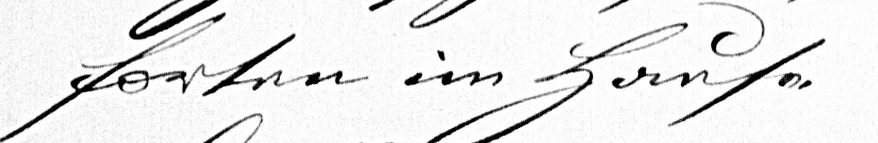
fortan im Hause.
